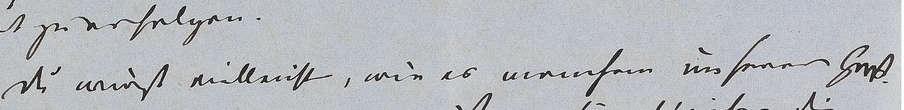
Du wirst vielleicht, wie es manchen unseren Groß-
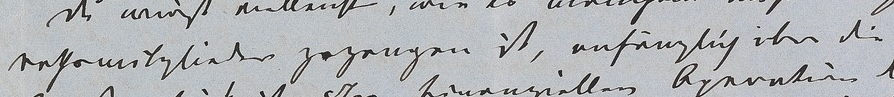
rathsmitgliedern gegangen ist, anfänglich über die
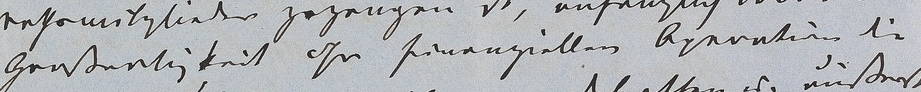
Großartigkeit dsr finanziellen Operation die
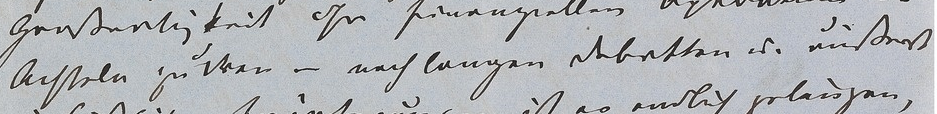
Achseln zucken – nach langen Debatten u. äußerst
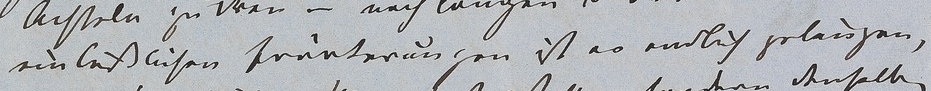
einläßlichen Erörterungen ist es endlich gelungen,
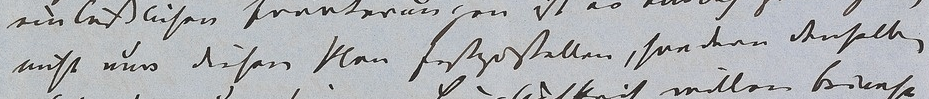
nicht nur diesen Plan festzustellen, sondern denselben
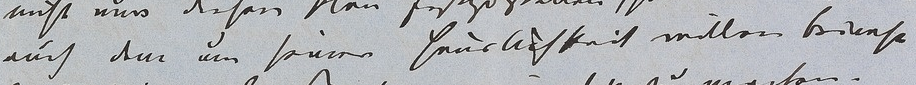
auch dem um seiner Häuslichkeit willen beinahe
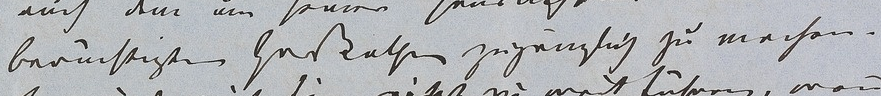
berüchtigten Gr Rathe zugänglich zu machen.
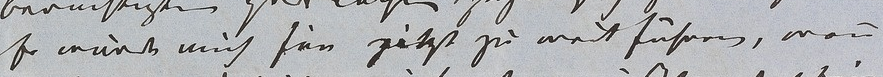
Es würde mich hier jetzt zu weit führen, wenn
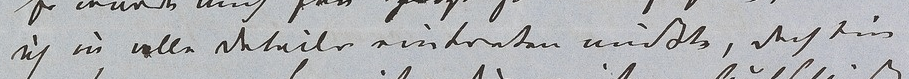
ich in volle Details eintreten müßte, doch bin
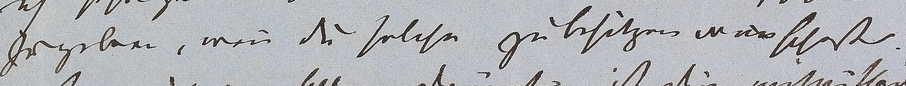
zu geben, wenn du solche zu besitzen wünschest.
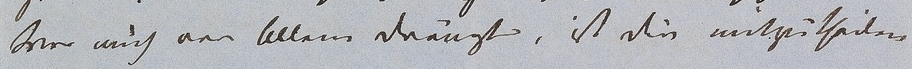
Was mich vor Allem drängt, ist Dir mitzutheilen
